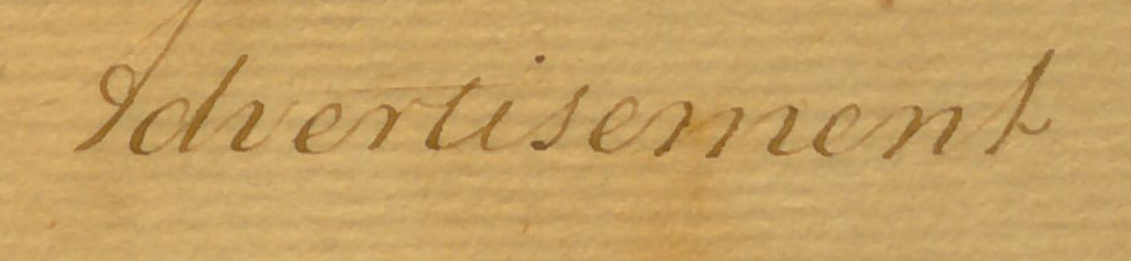Advertisement
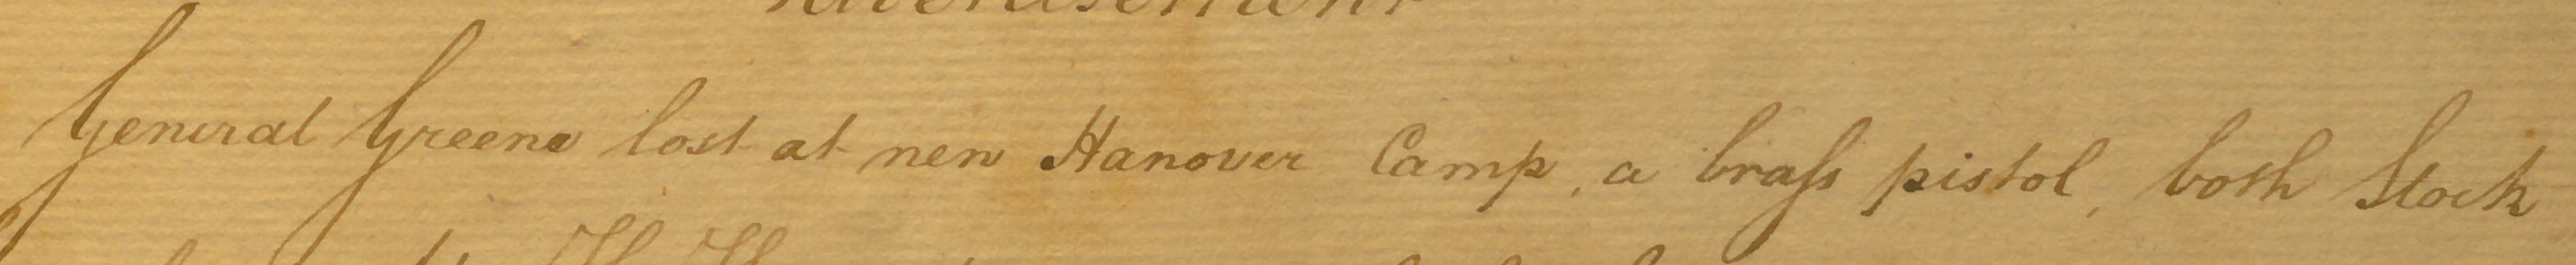General Greene last at new Hanover Camp a brass pistol both Stock
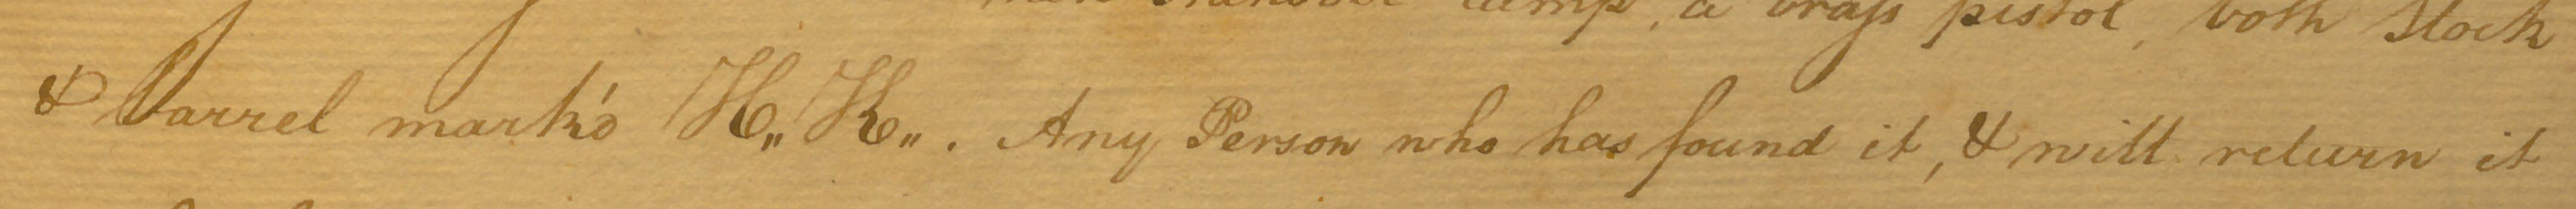& barrel mark'd H.K. Any Person who has found it, & will return it
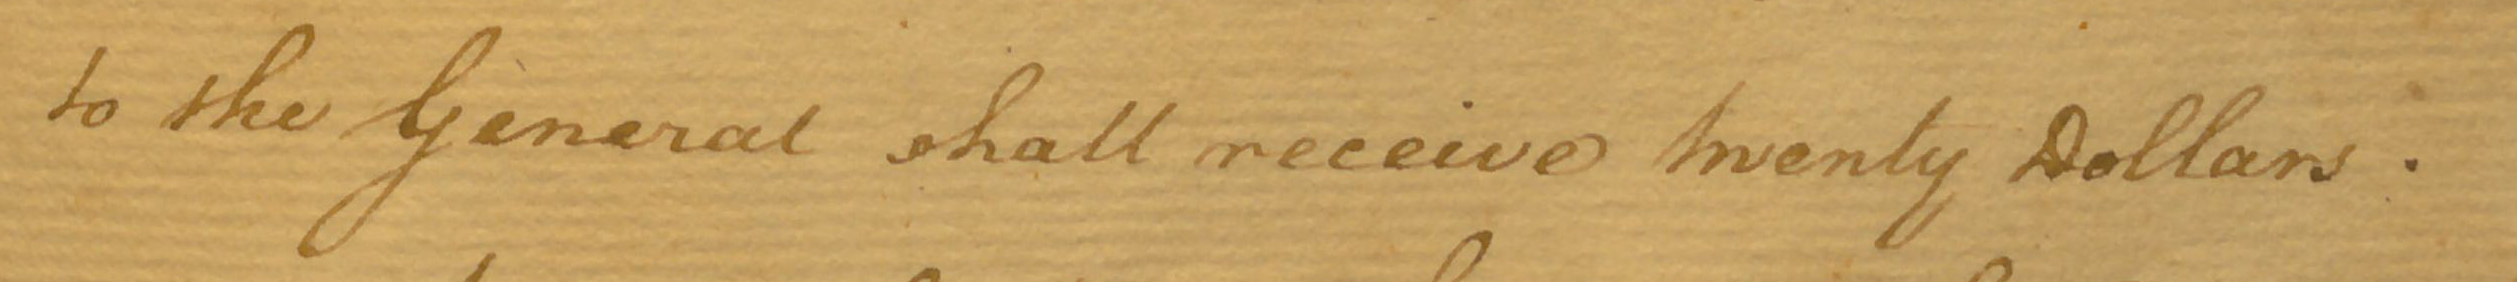to the General shall receive twenty Dollars.
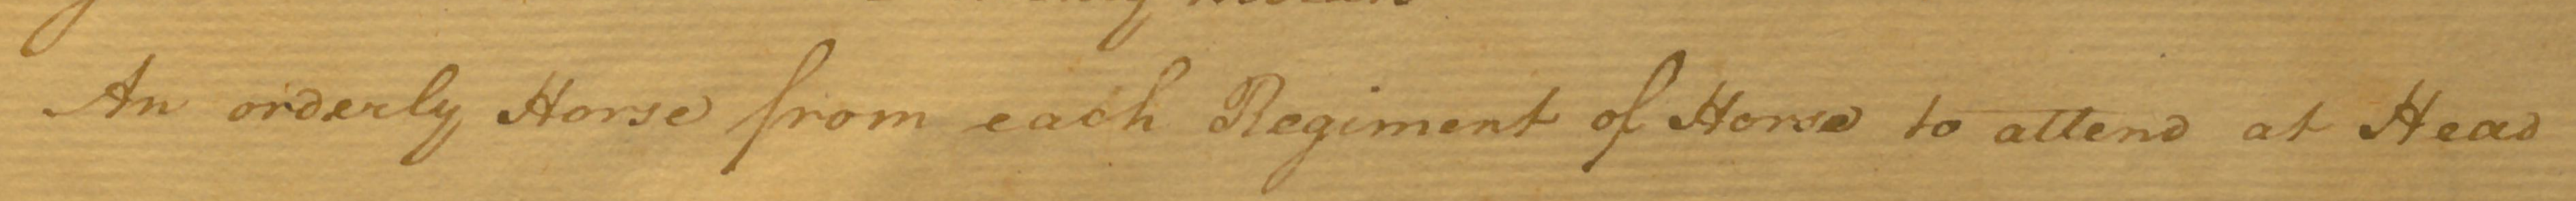An orderly Horse from each Regiment of Horse to attend at Head
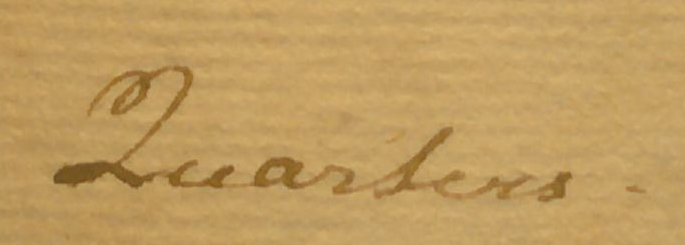Quarters.
